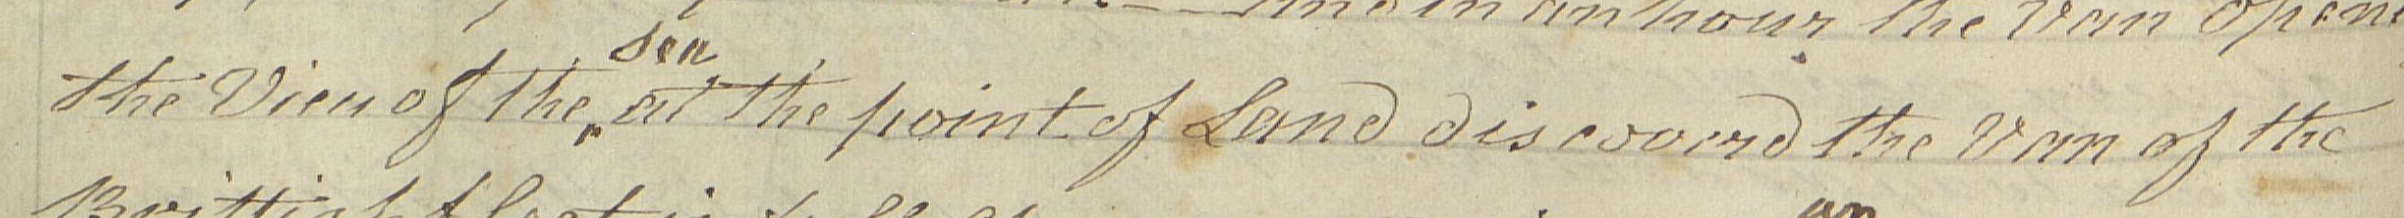The Van of the ^ at the point of Land discoverd the Van of the
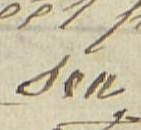Sea
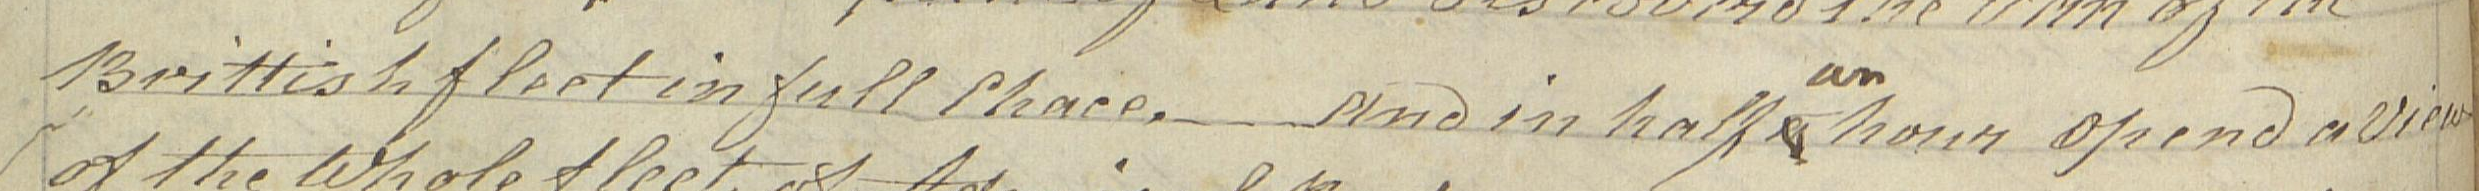Brittish fleet in full Chace, and in half ^ hour opend a View
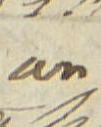an
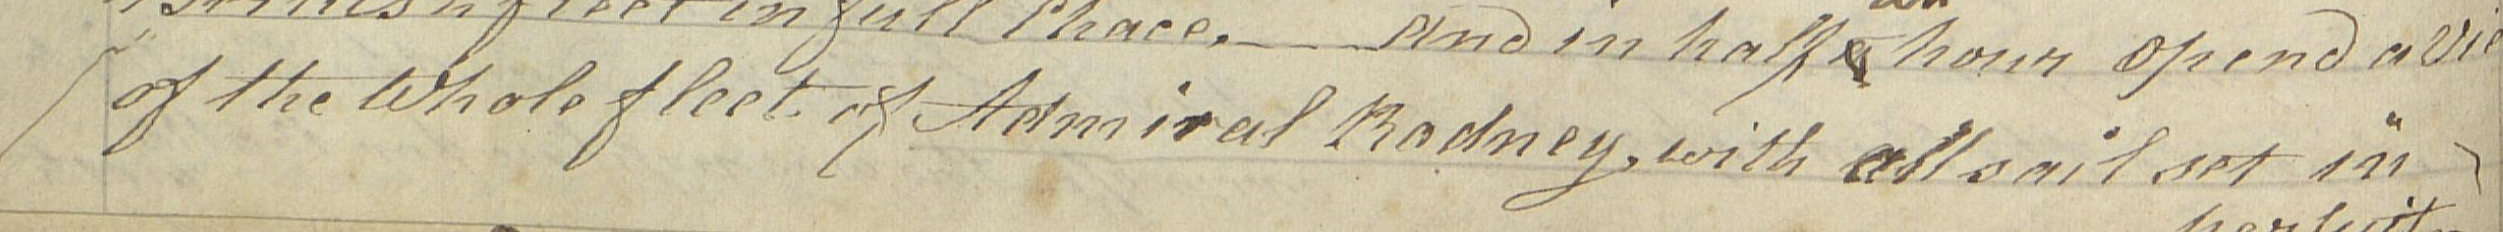of the whole fleet of Admiral Rodney with all sail set in
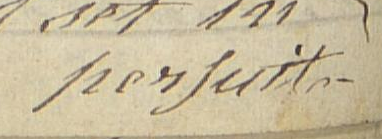persuit
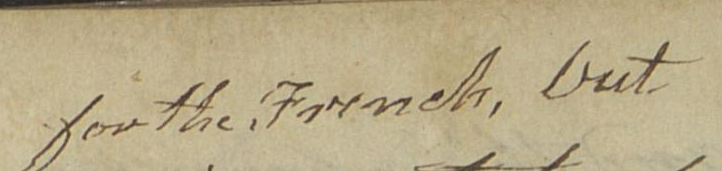for the French, but
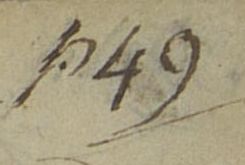p49
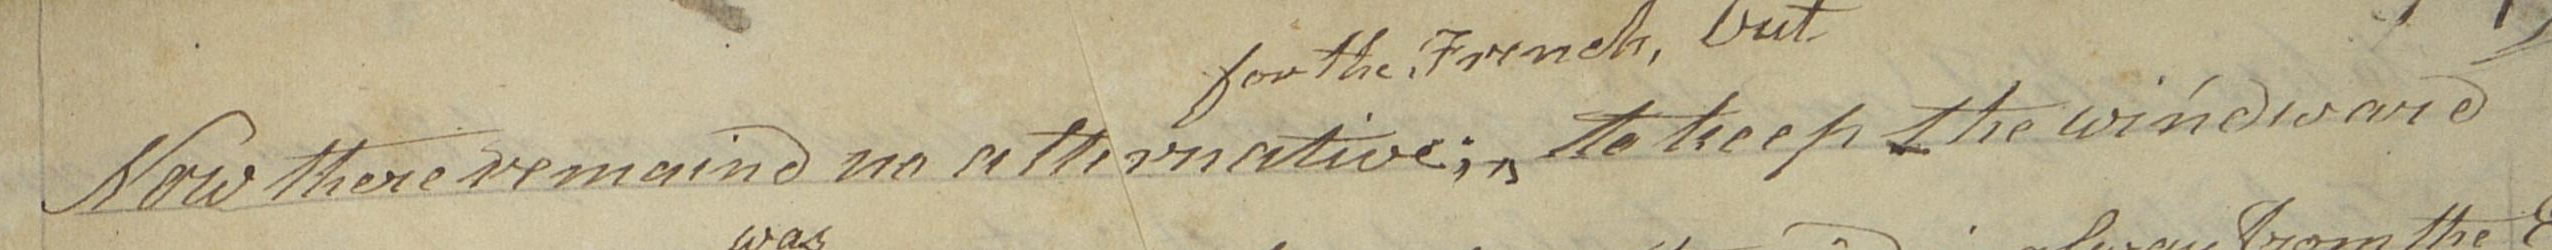Now there remaind no alternative; ^ to keep the windward
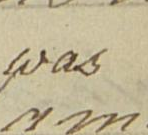was
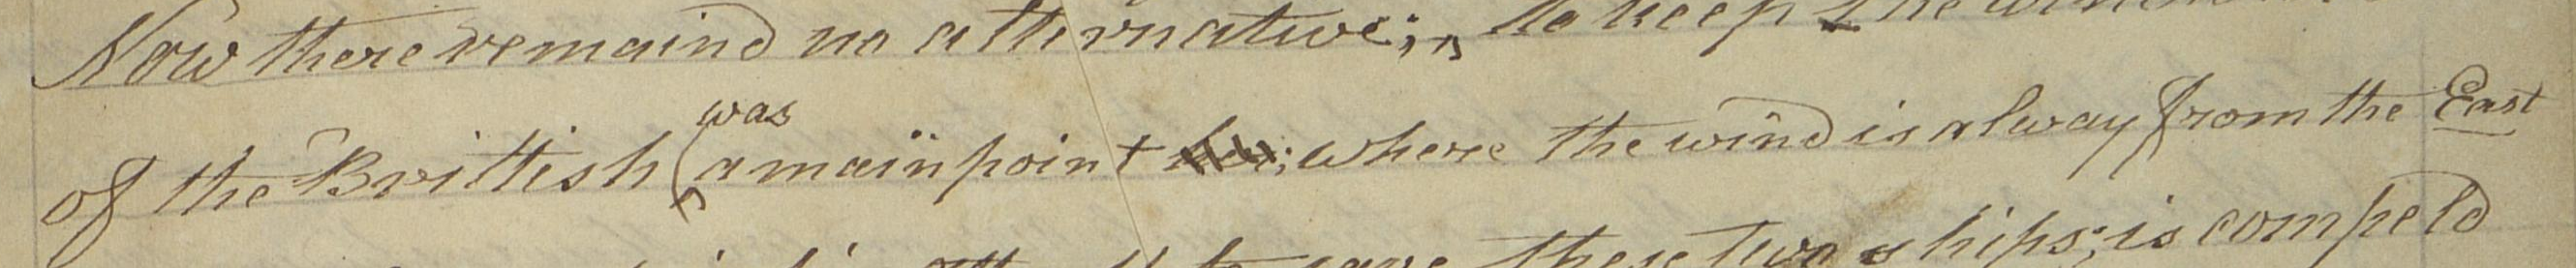of the Brittish ^ (a main point her; where the wind is alway from the East
